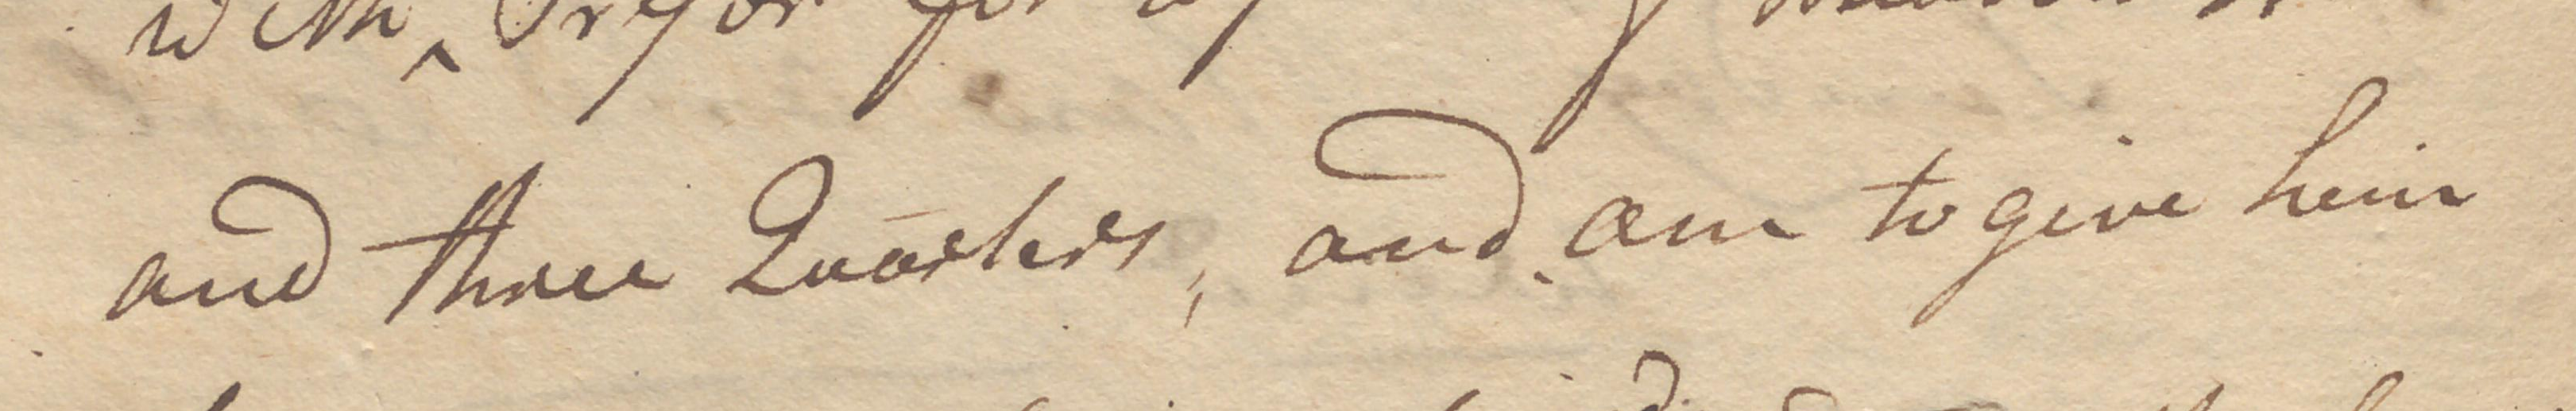and three Quarters, and am to give him
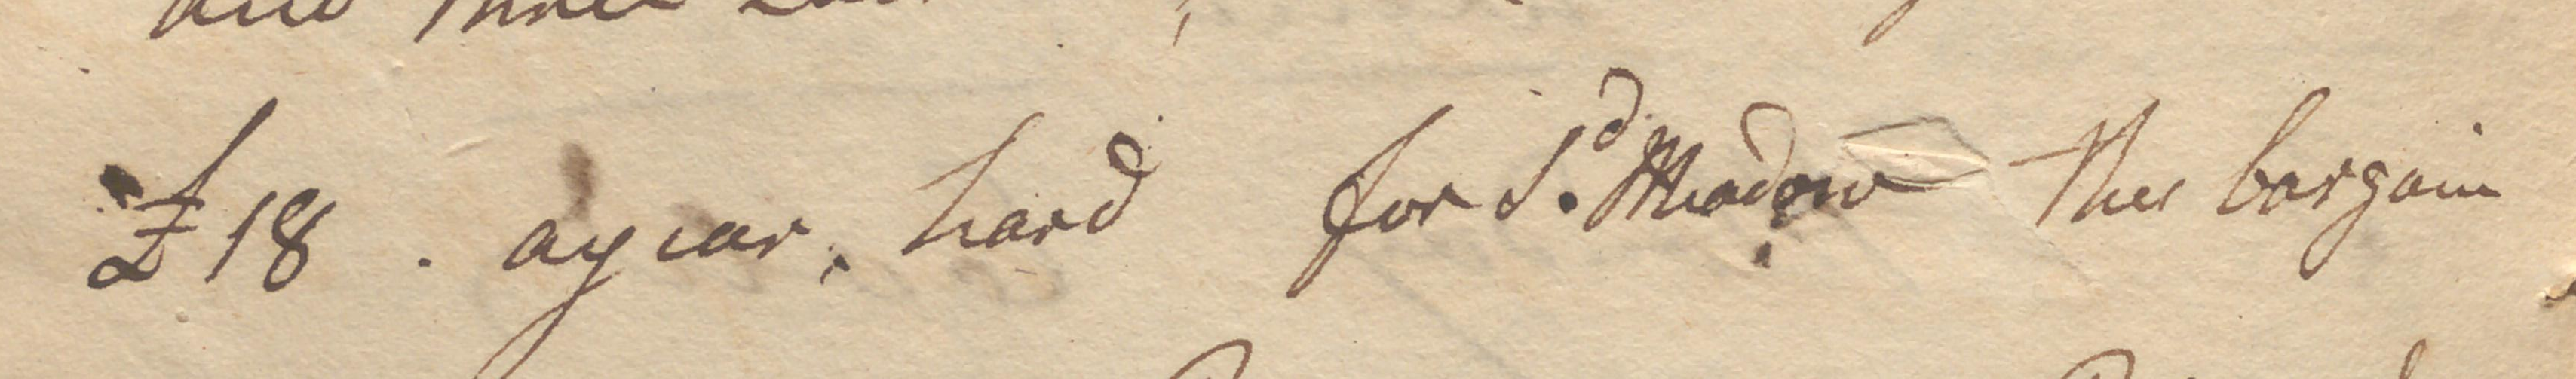£18. a year hard for s^d. Meadow the bargain
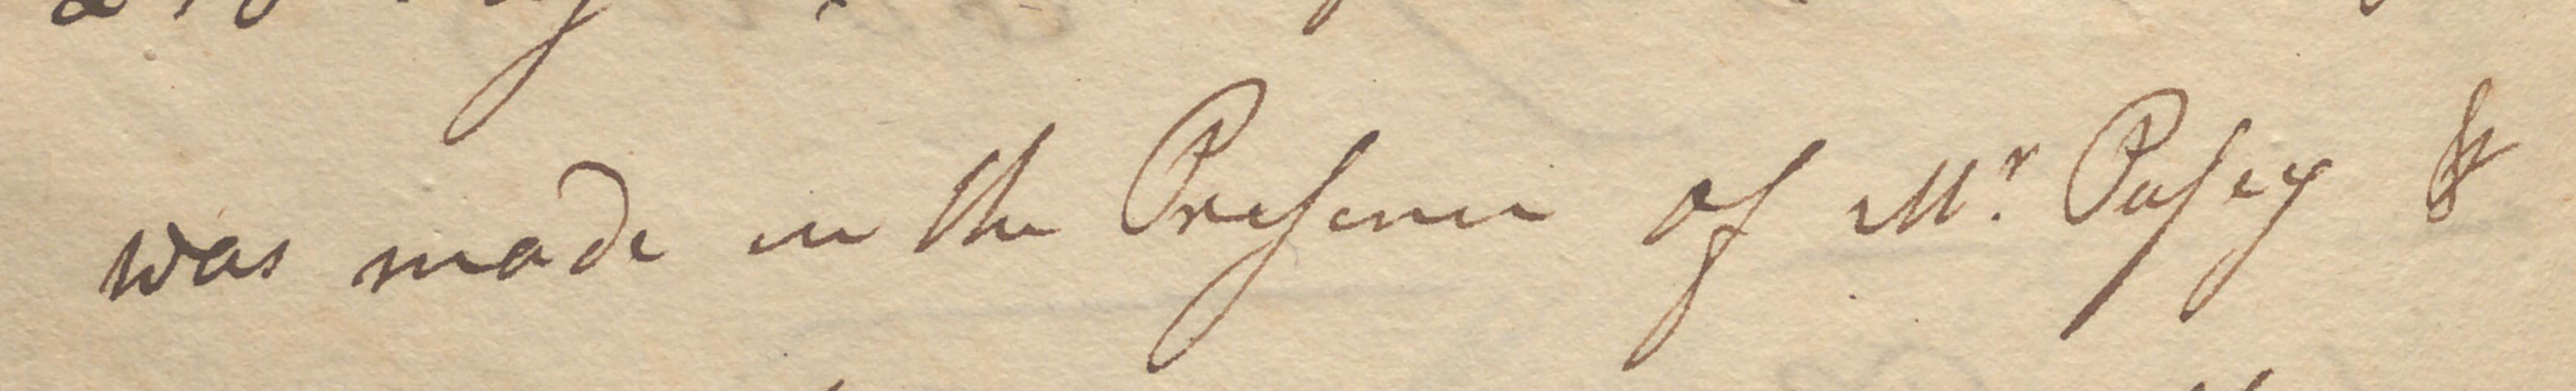was made in the Presence of M^r. Pusey &
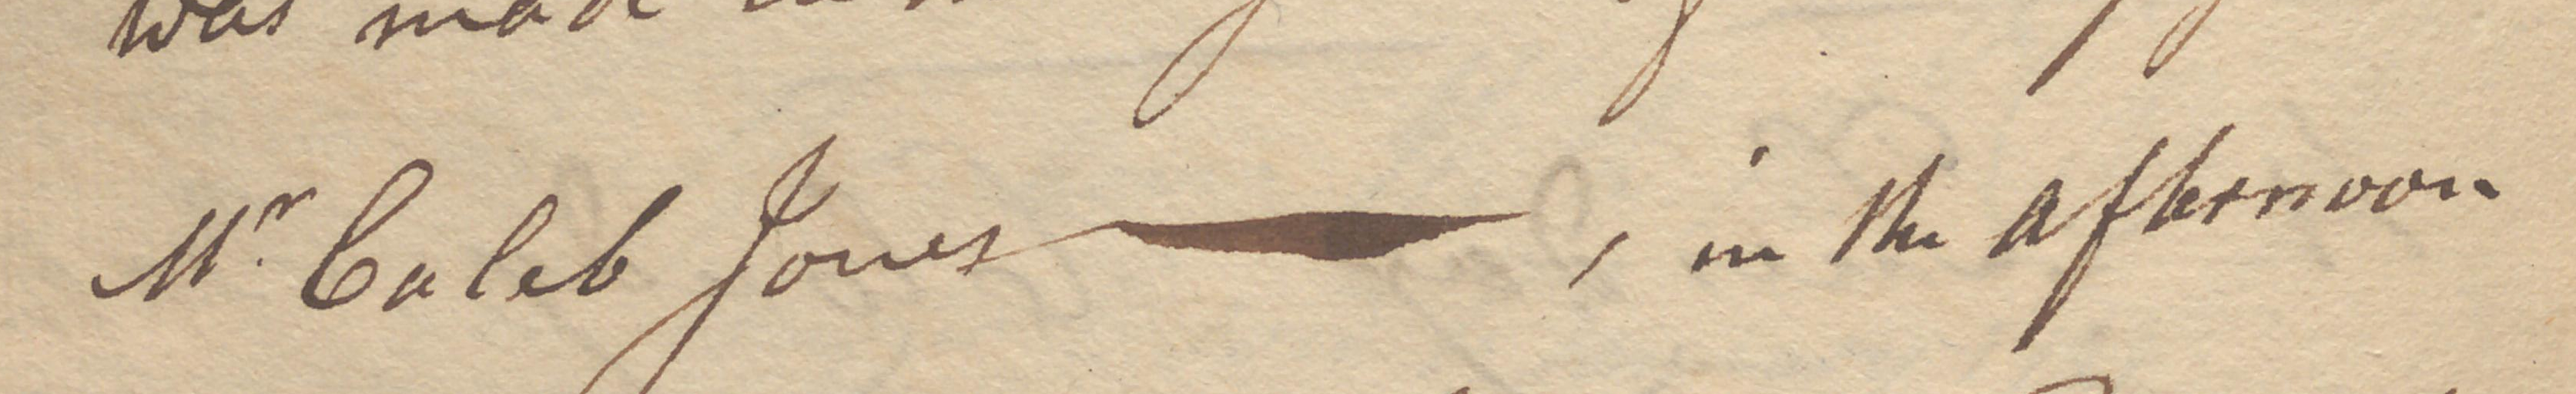M^r Caleb Jones, in the afternoon
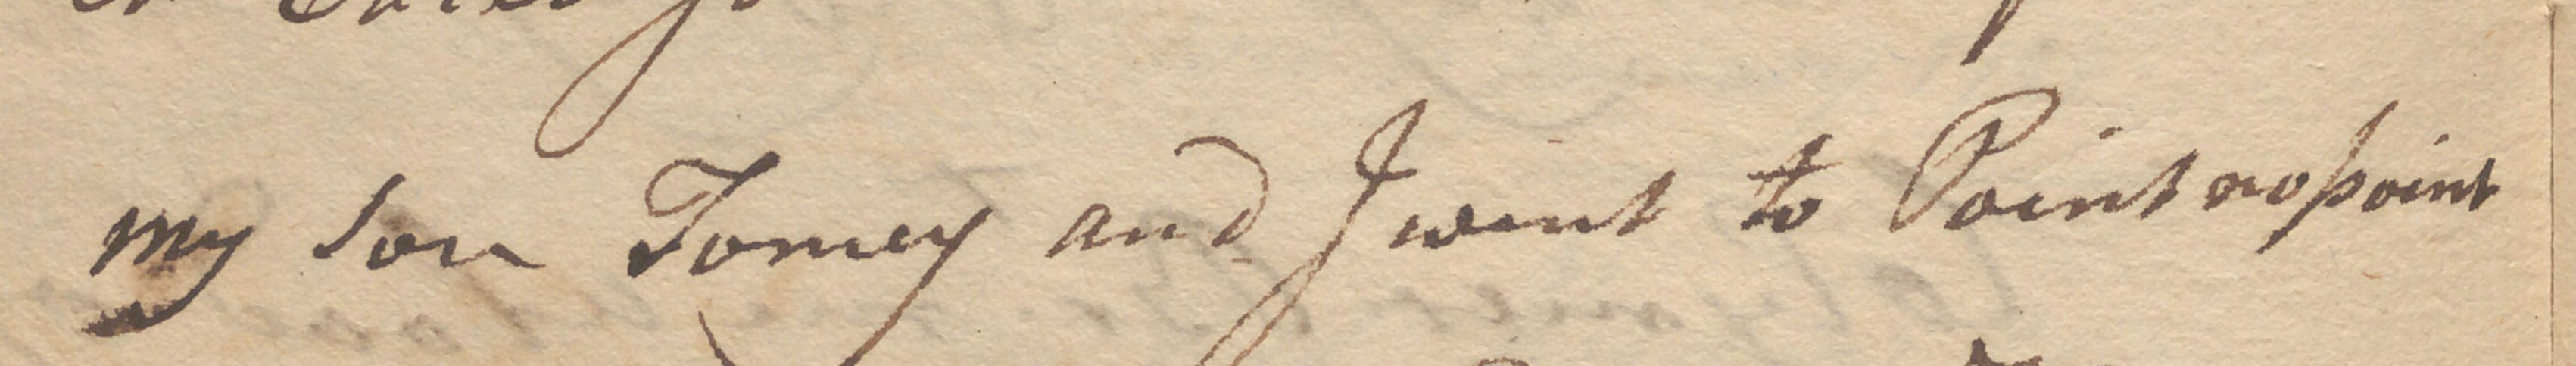my son Tomey and I went to Pointnopoint
